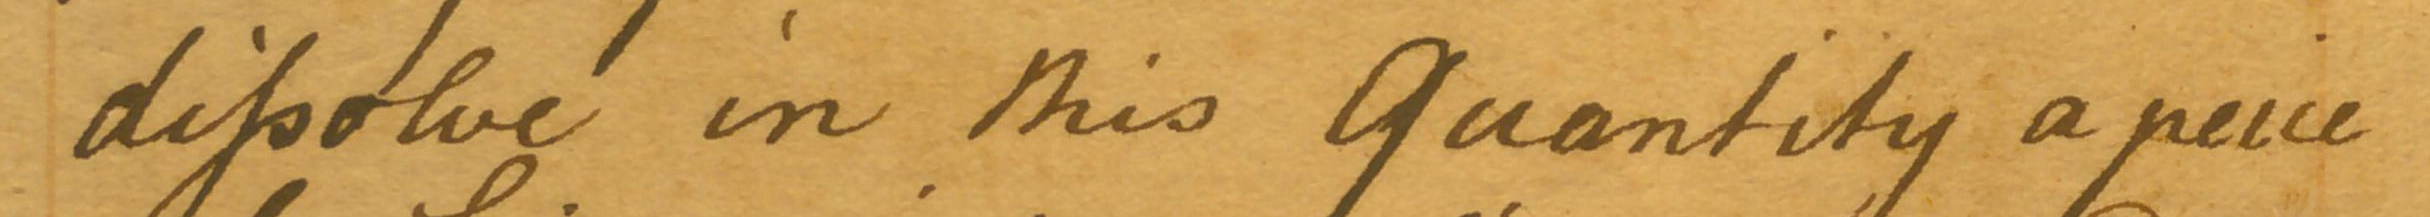dissolve in this quantity a peice
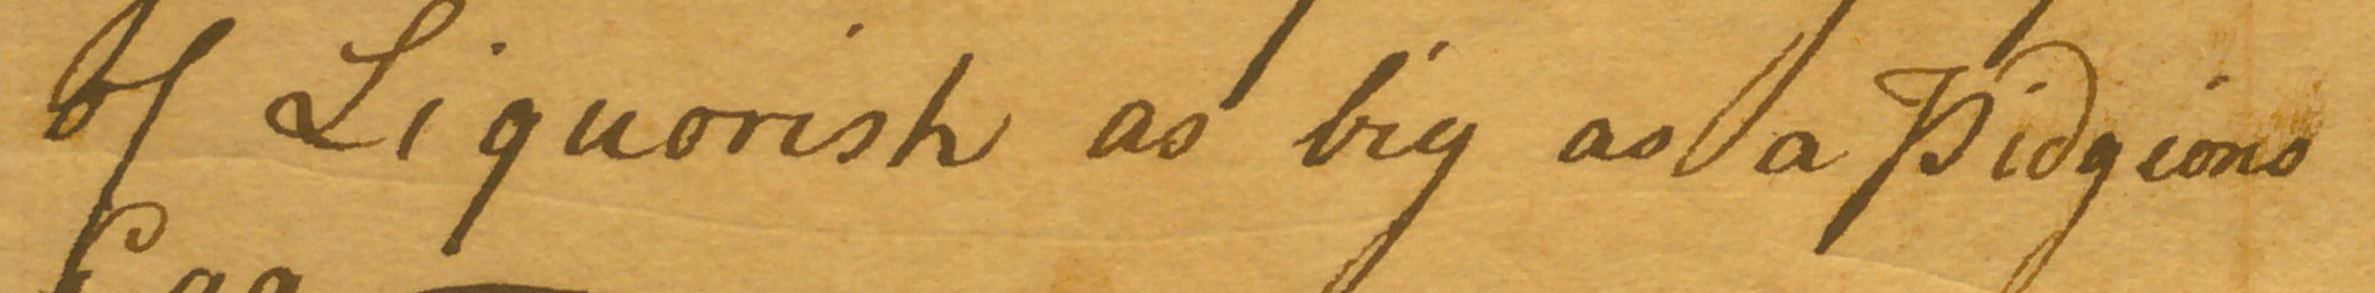of Liquorish so big as a pidgions
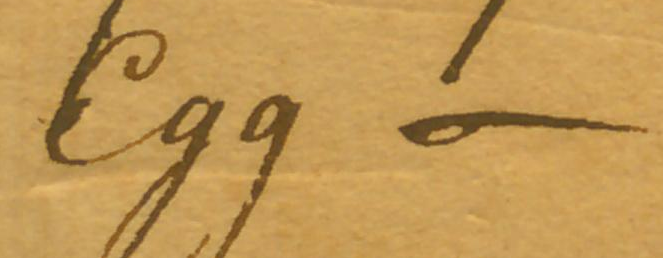Egg-
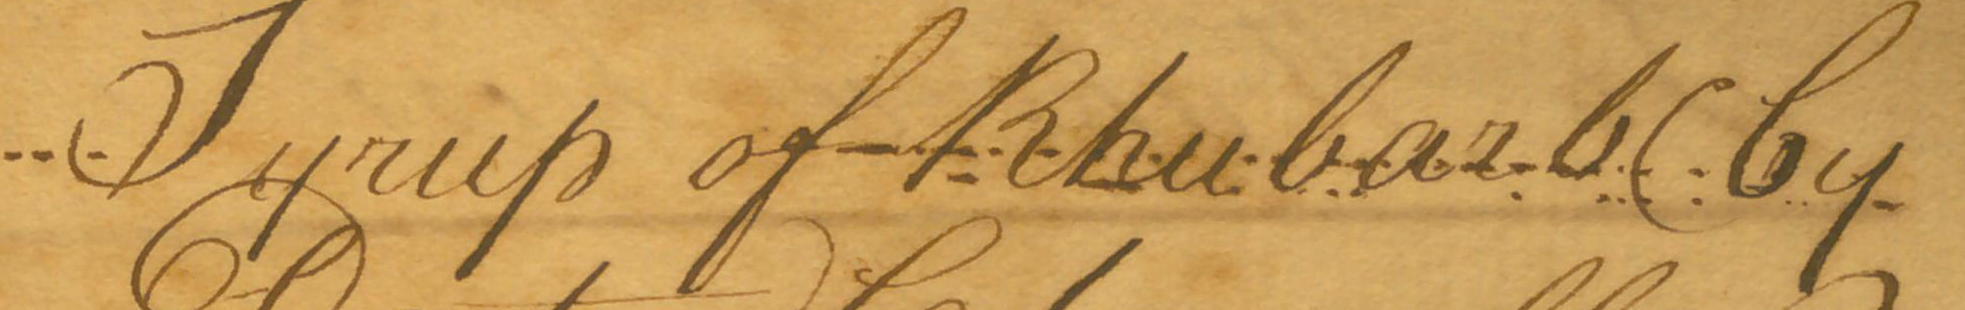Syrup of Rhubarb (by
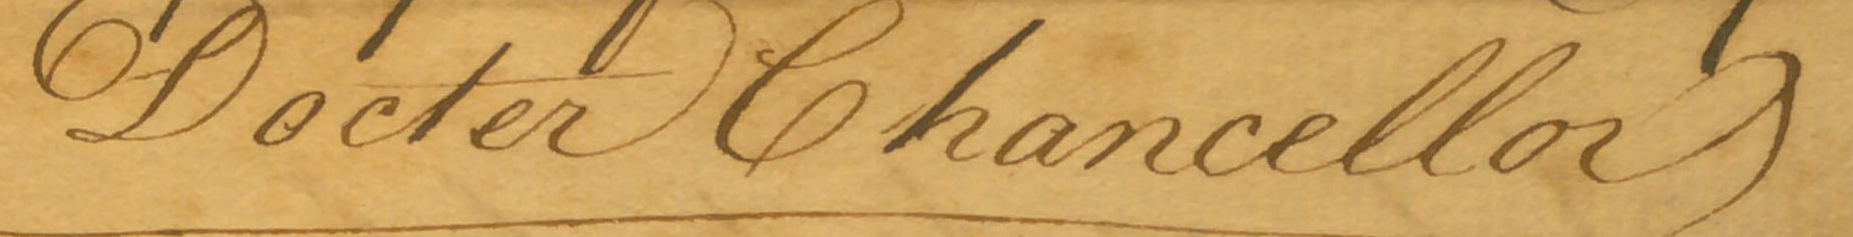Doctor Chancellor)
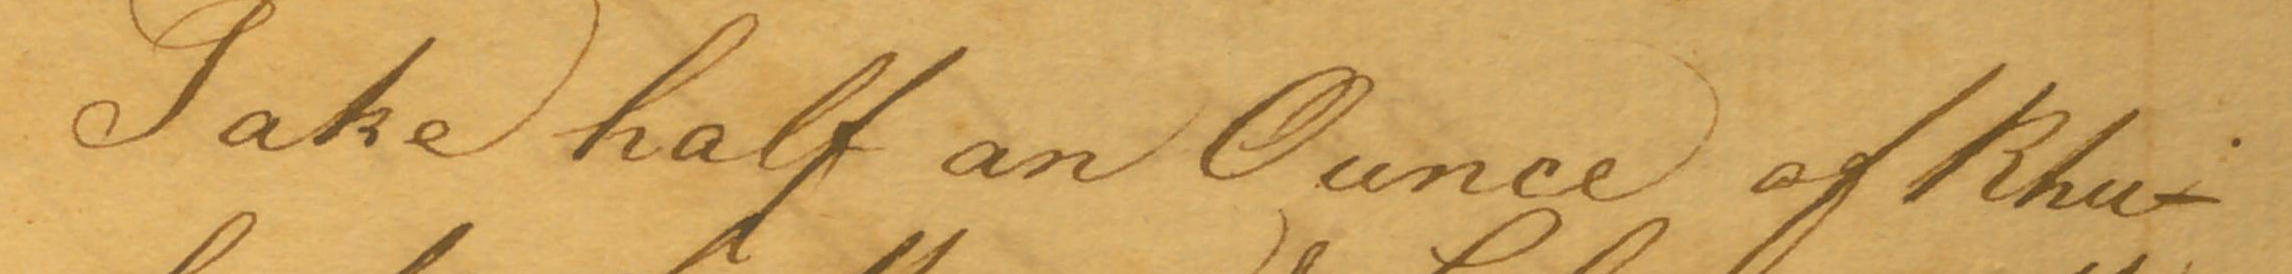Take half an Ounce of Rhu-
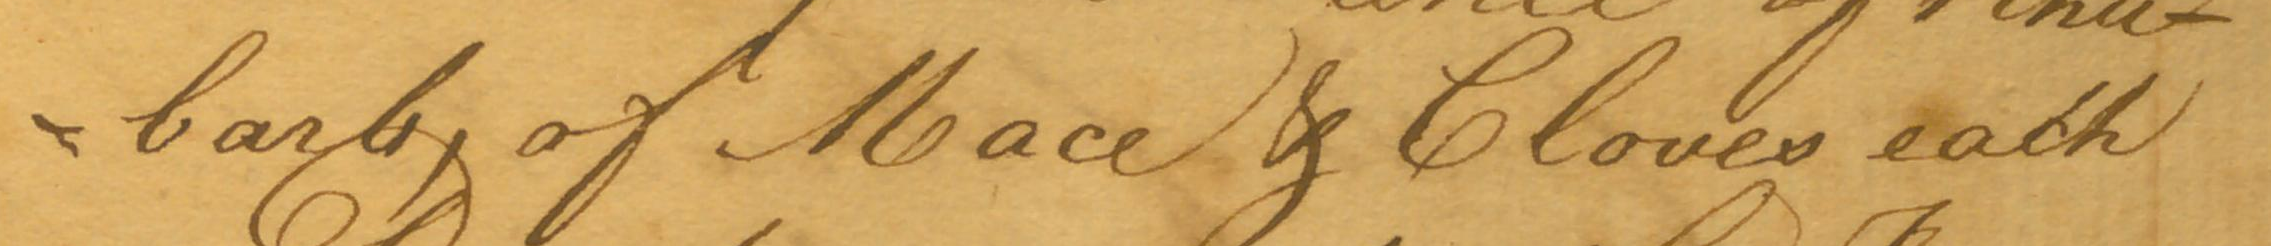-barb, of Mace & Cloves each
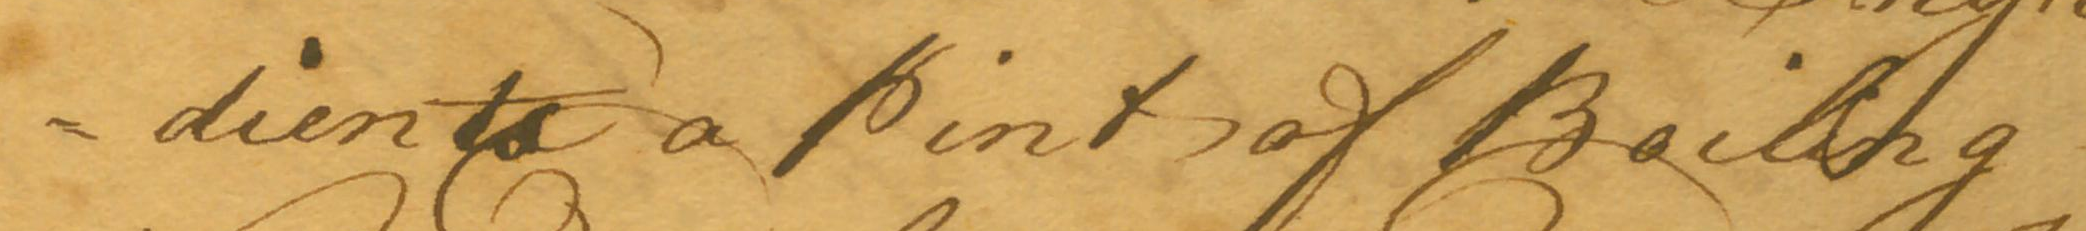-dients a pint of Boiling
